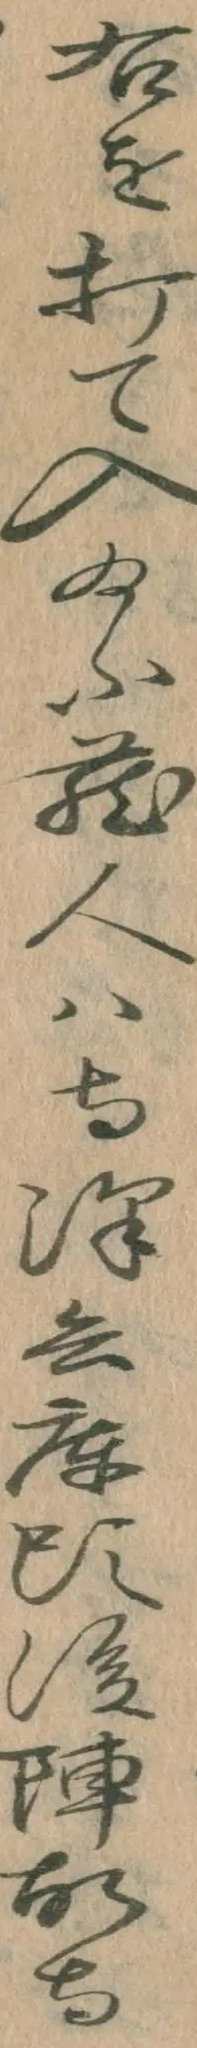右を打て入ゐふ蔵人は寺沢兵庫頭後陣故寺
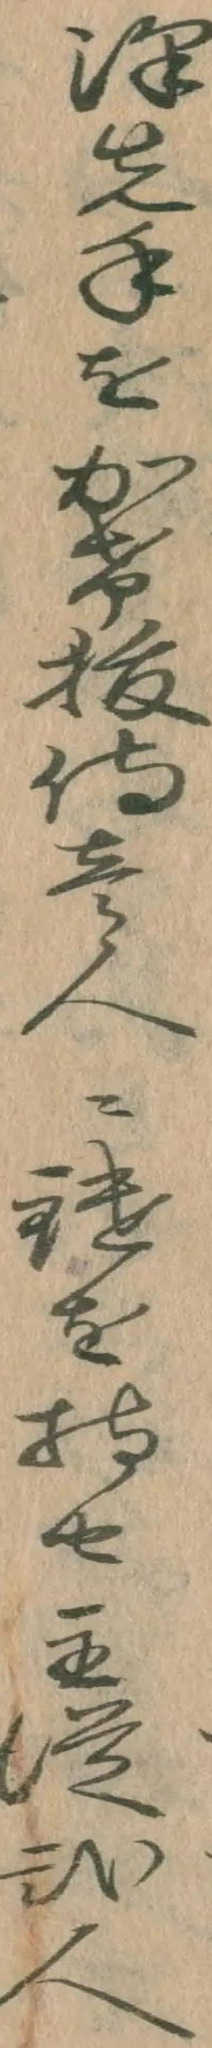沢先手をか希抜侍壱人に鑓を持せ主従弐人
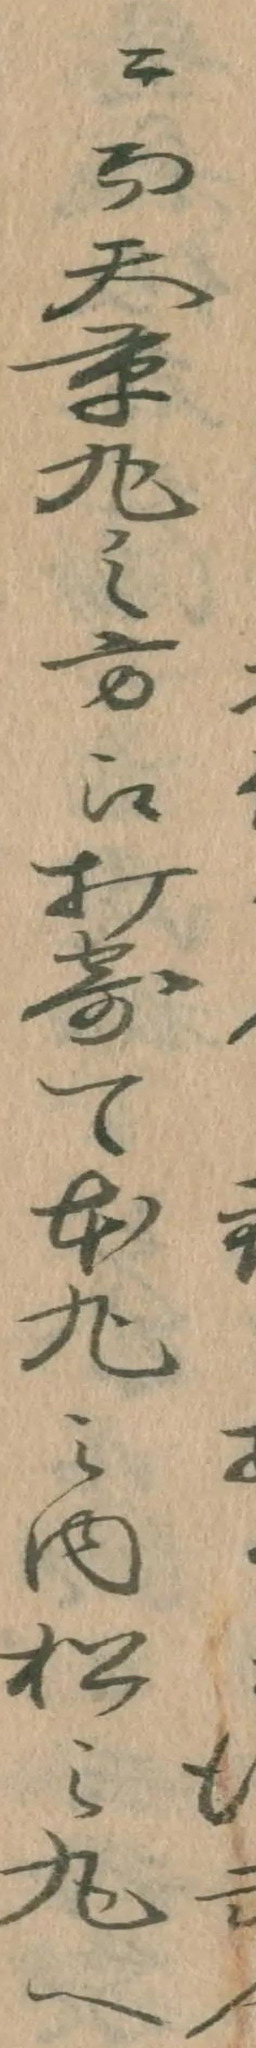に而天草丸之方江打寄て本丸之内松の丸へ
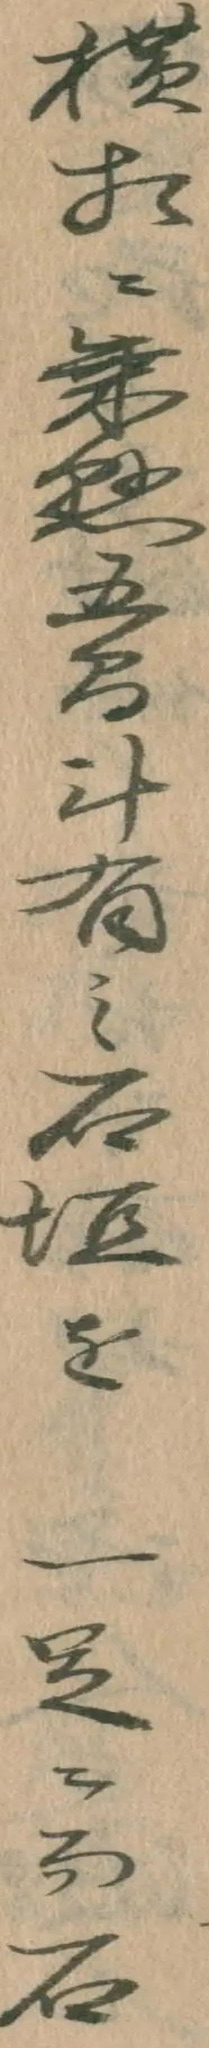横相に乗懸五間斗有之石垣を一足に而石
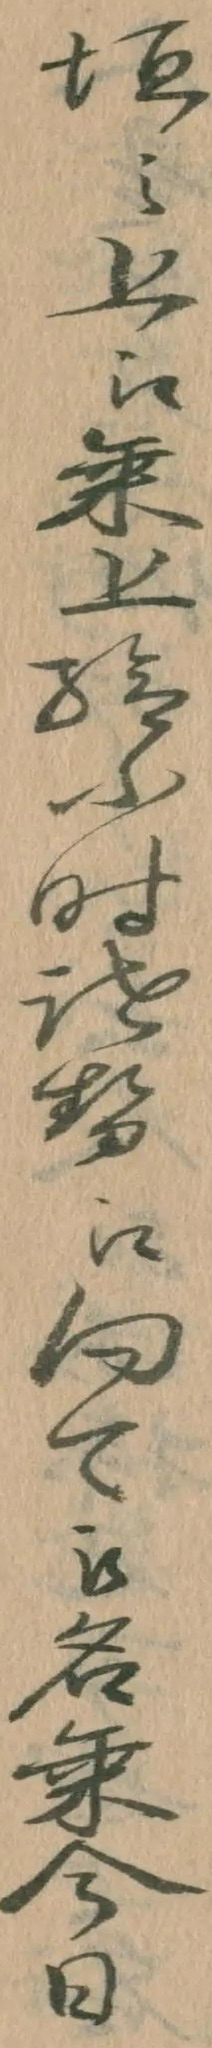垣之上江乗上給ふ時諸勢江向て被名乗今日
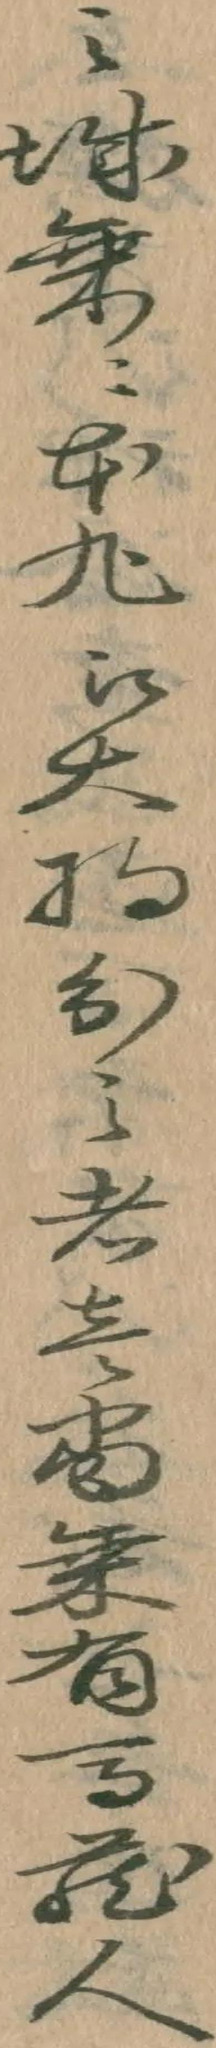之城乗に本丸江大将分之者壱番乗有馬蔵人
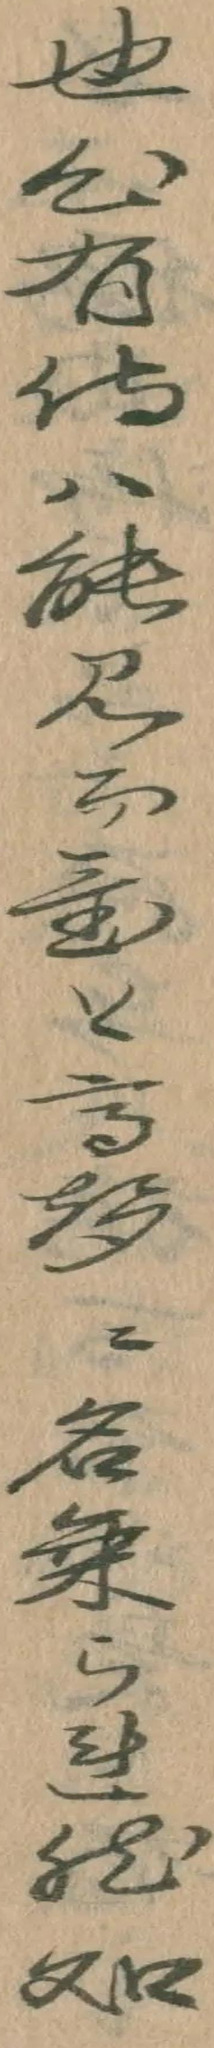也心有侍は能見而置と高声に名乗ら連然処
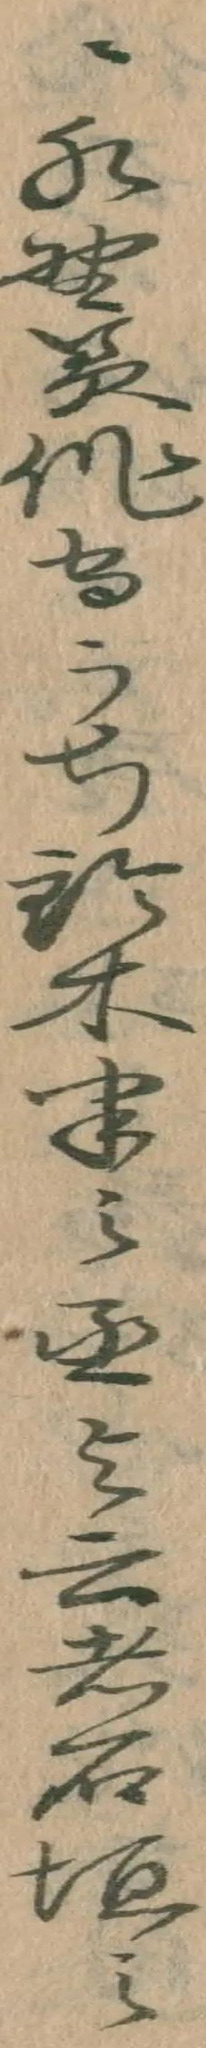に水野美作守うち鈴木半之丞与云者石垣之
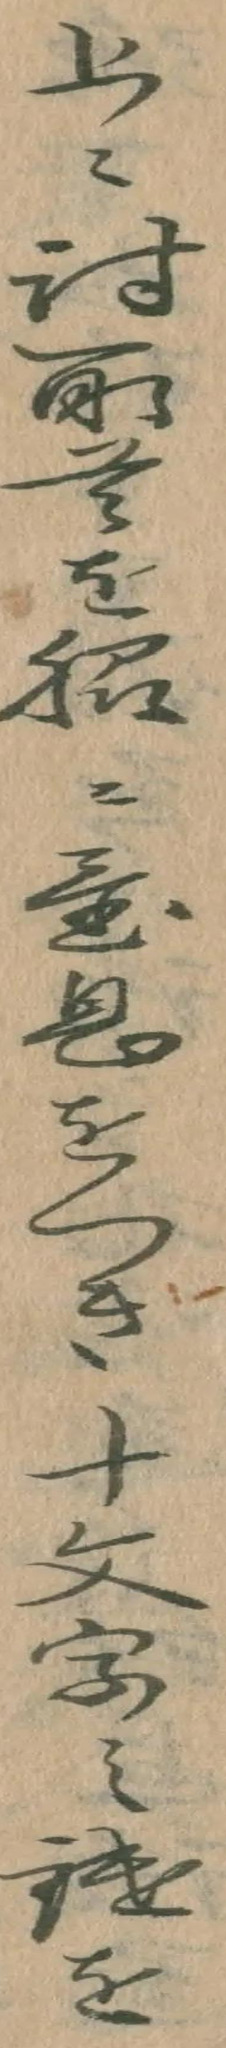上に討取首を脇に置息をつき十文字之鑓を
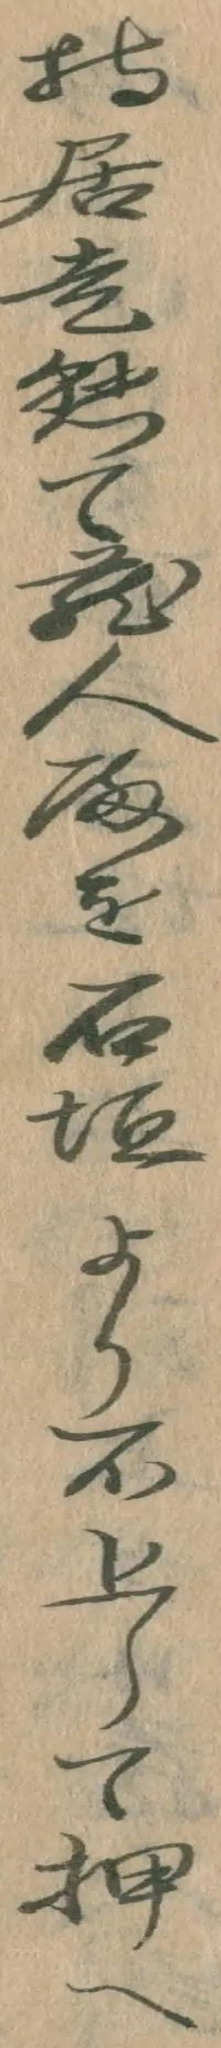持居走懸て蔵人殿を石垣より不上して押へ
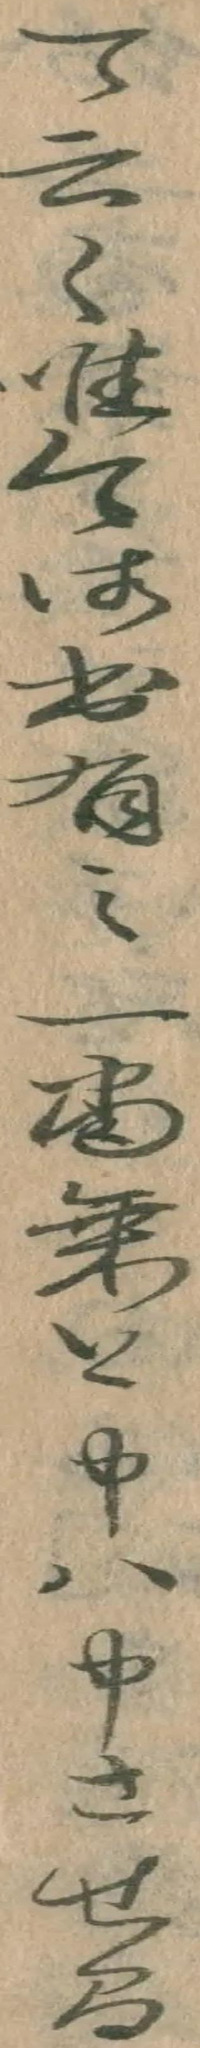て云く唯今御出有之一番乗と申は申させ間
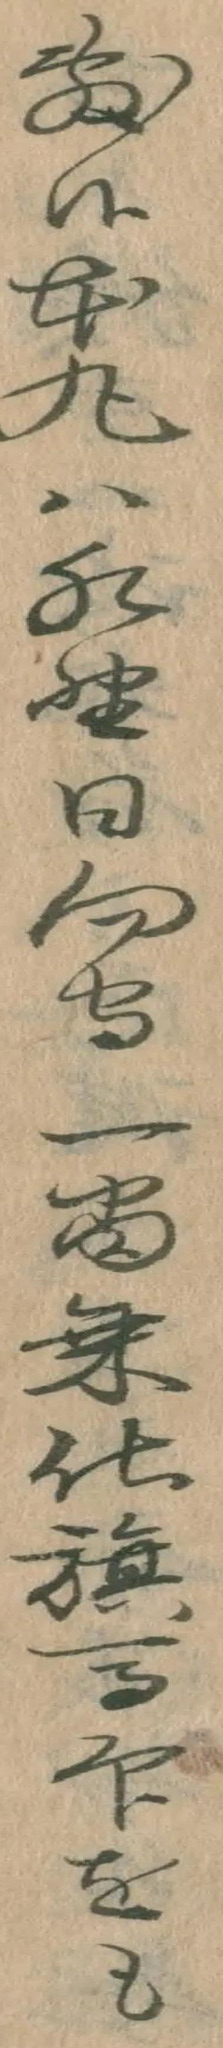敷候本丸は水野日向守一番乗仕旗馬印をも
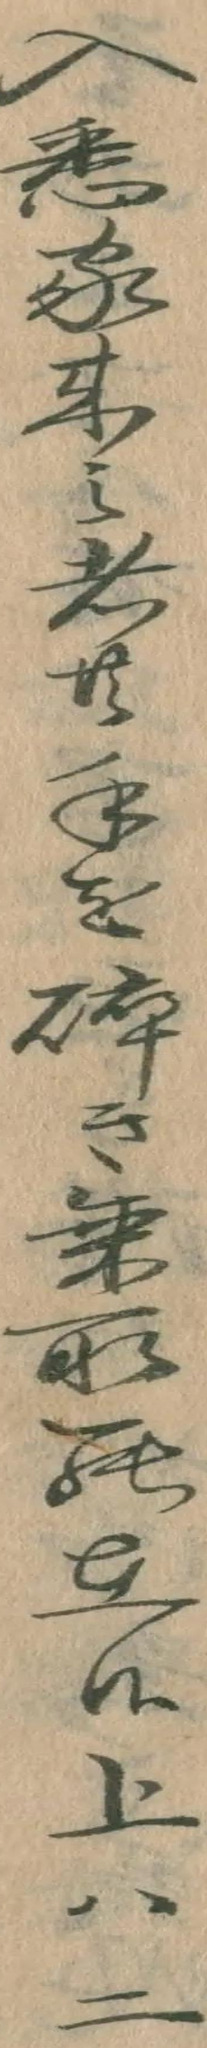入悉家来之者共手を砕き乗取罷在候上は二
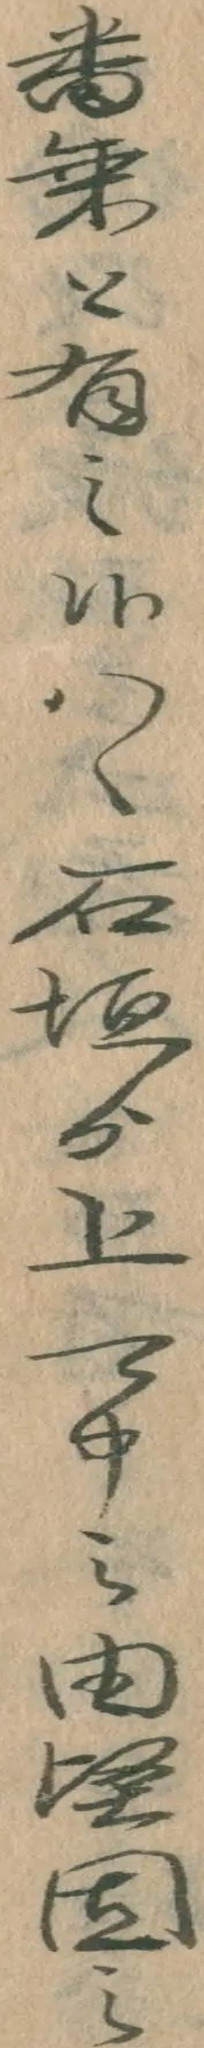番乗と有之候はゝ石垣ゟ上可申之由堅固之
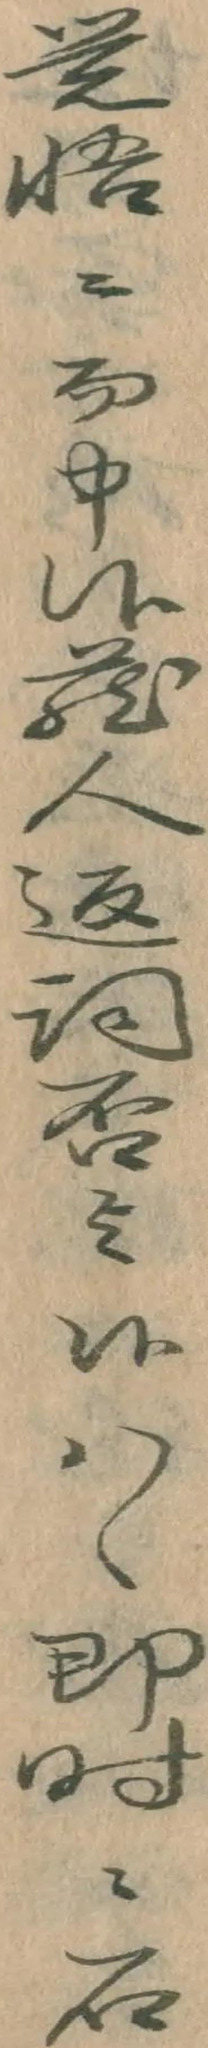覚悟に而申候蔵人返詞否与候はゝ即時に石

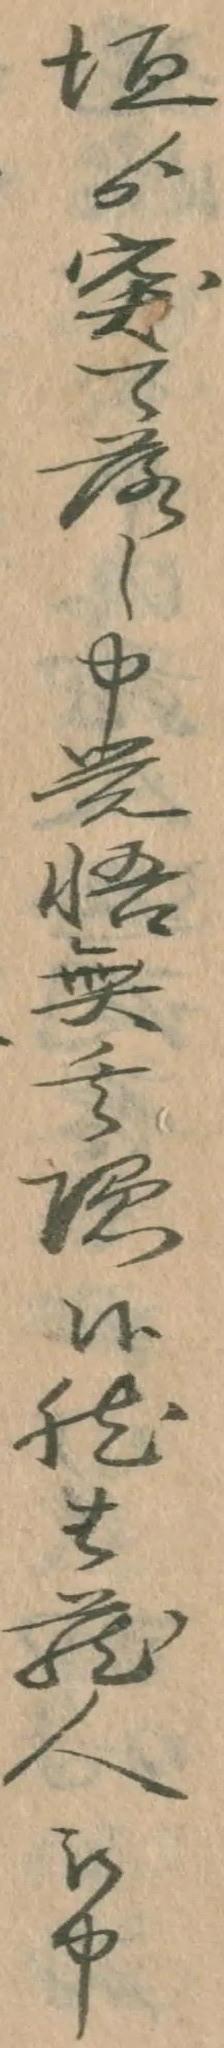垣ゟ突て落し申覚悟無其隠候然者蔵人被申
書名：切支丹御退治記 49巻. [7]
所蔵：国立国会図書館 National Diet Library, JAPAN
